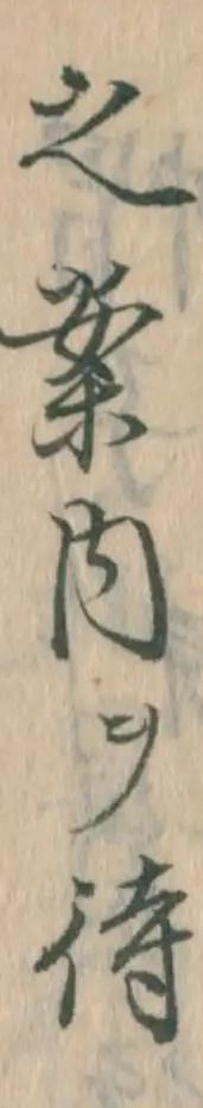之案内ヲ待
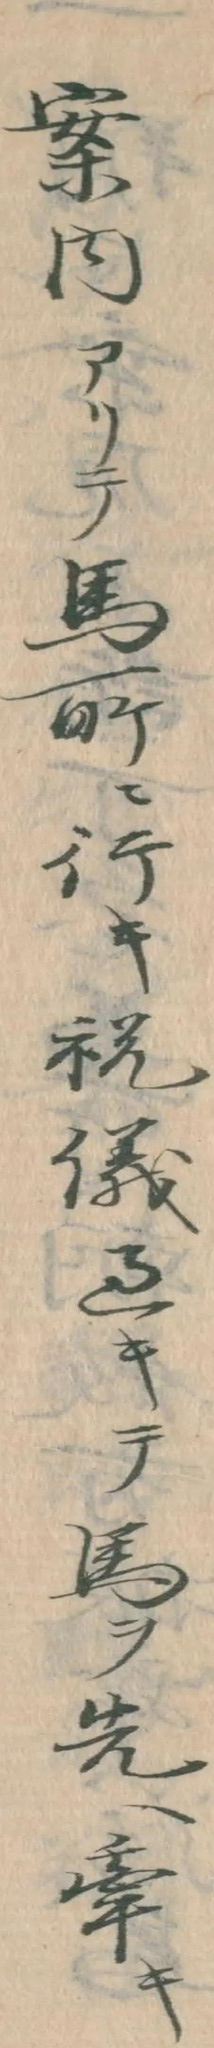一案内アリテ馬所ニ行キ祝儀過キテ馬ヲ先ヘ牽キ
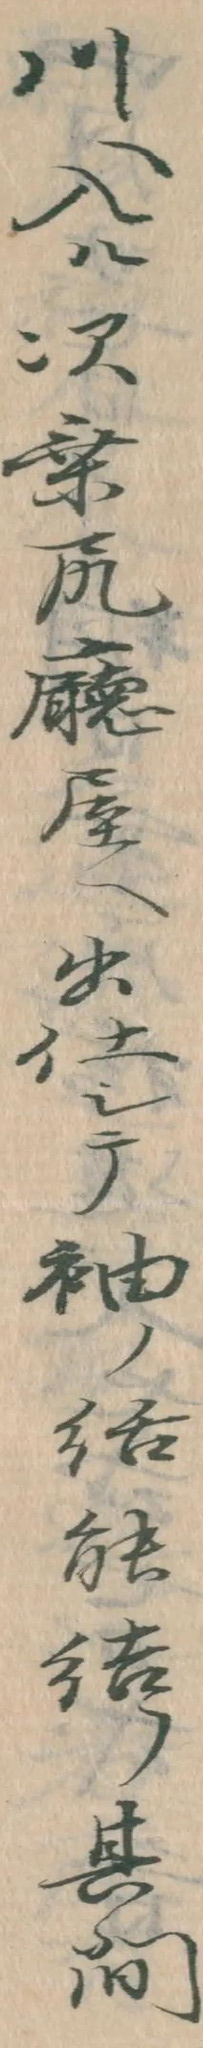川へ入ル次乗尻庁屋へ出仕シテ袖ノ絬能結フ其間ニ
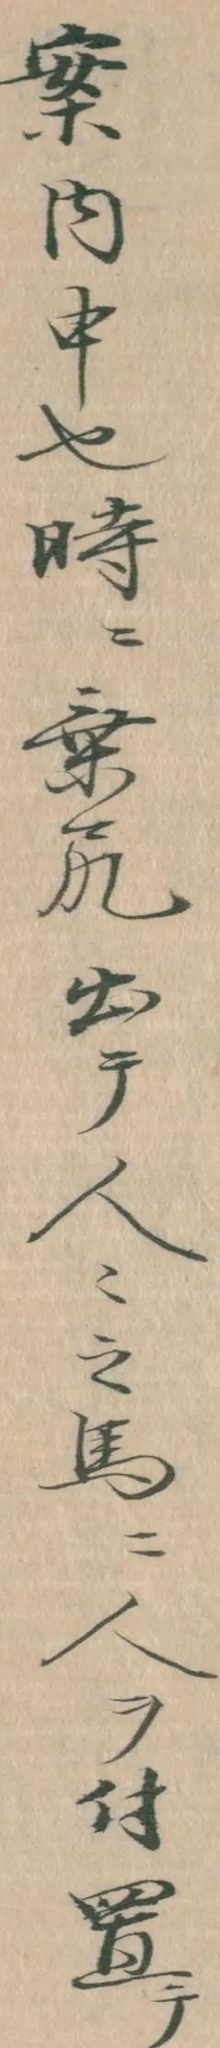案内申也時ニ乗尻出テ人々之馬ニ人ヲ付置テ
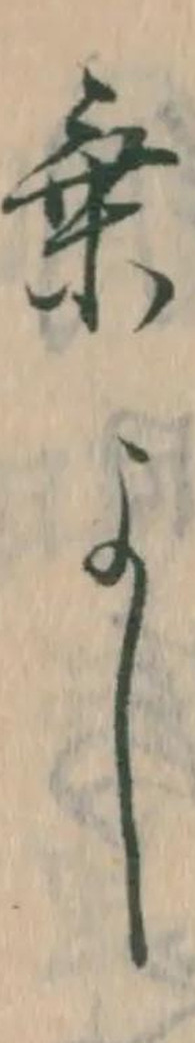乗よし
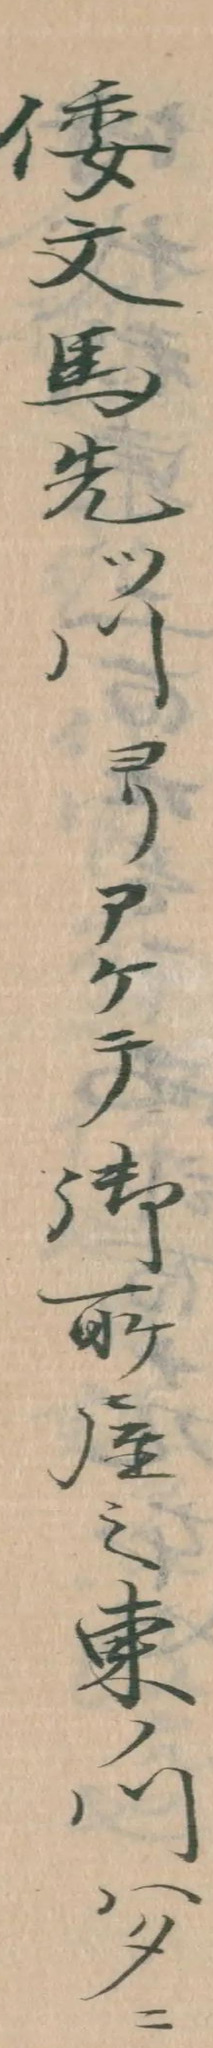一倭文馬先ツ川ヨリアケテ御所屋之東ノ川ハタニ
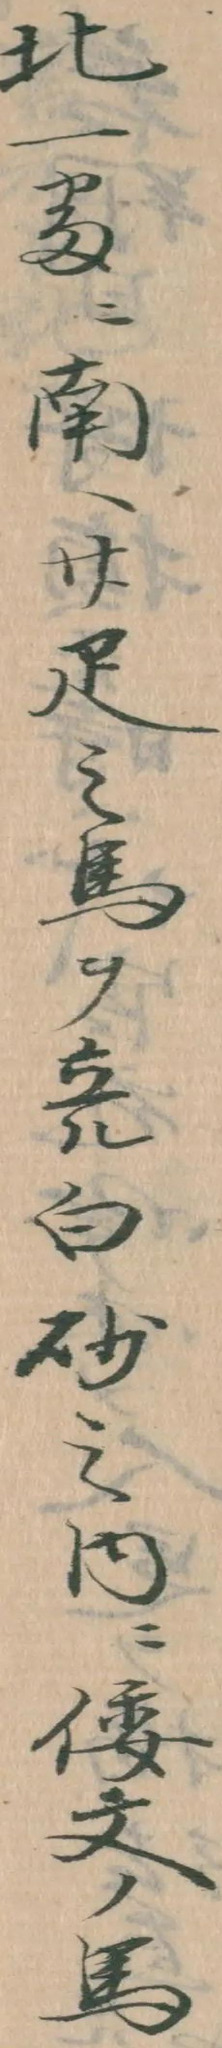北一番ニ南ヘ廿疋之馬ヲ立ル白砂之内ニ倭文ノ馬
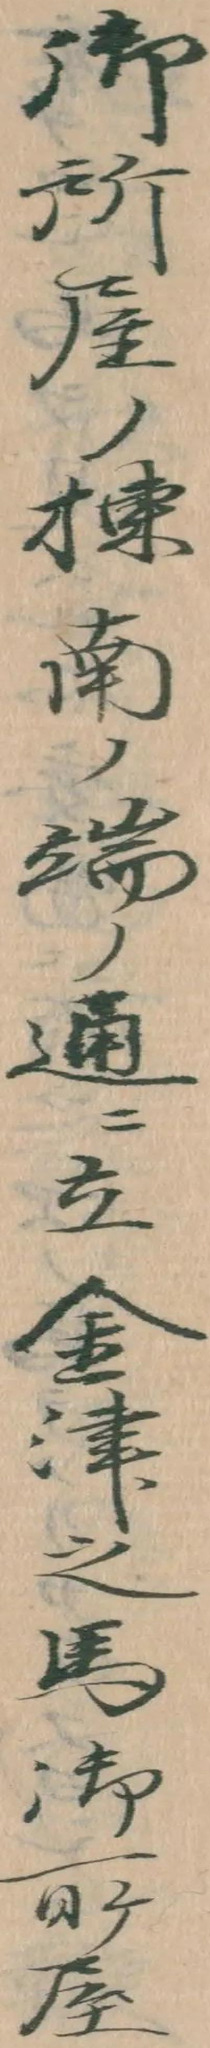御所屋ノ棟南ノ端ノ通ニ立金津之馬御所屋
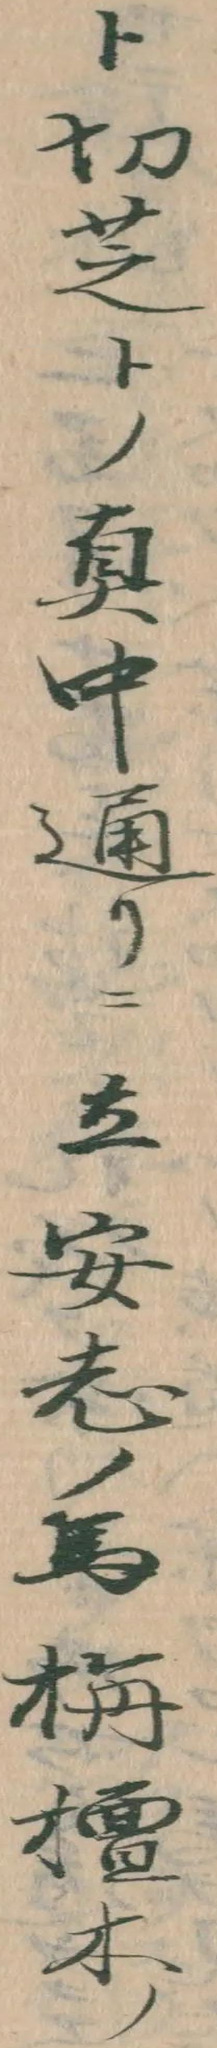ト切芝トノ真中通リニ立安志ノ馬栴檀木ノ
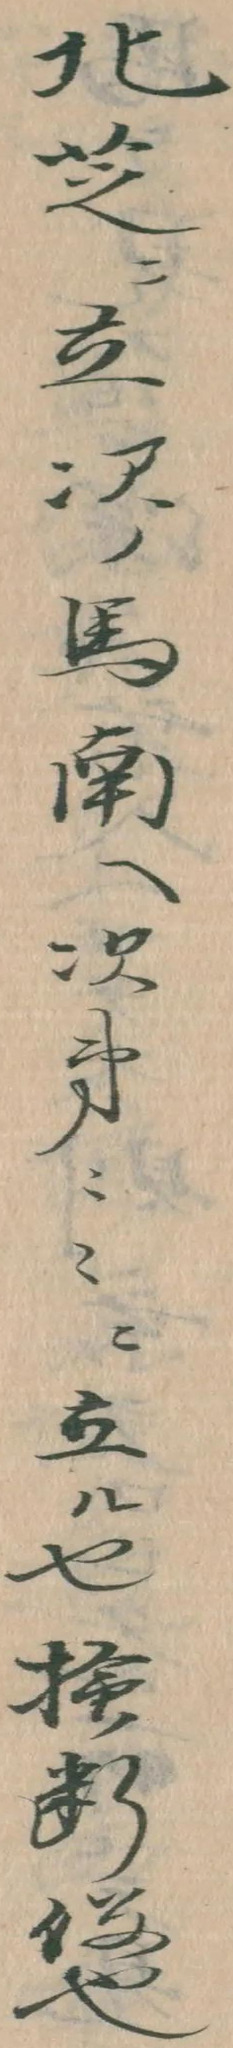北芝ニ立次ノ馬南ヘ次第々ニ〳〵ニ立ル也検断役也
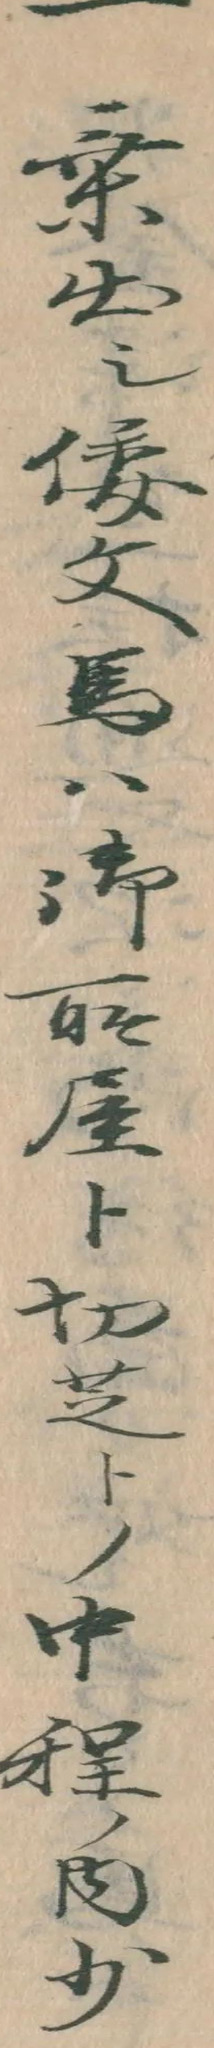一乗出シ倭文馬ハ御所屋ト切芝トノ中程ノ内少
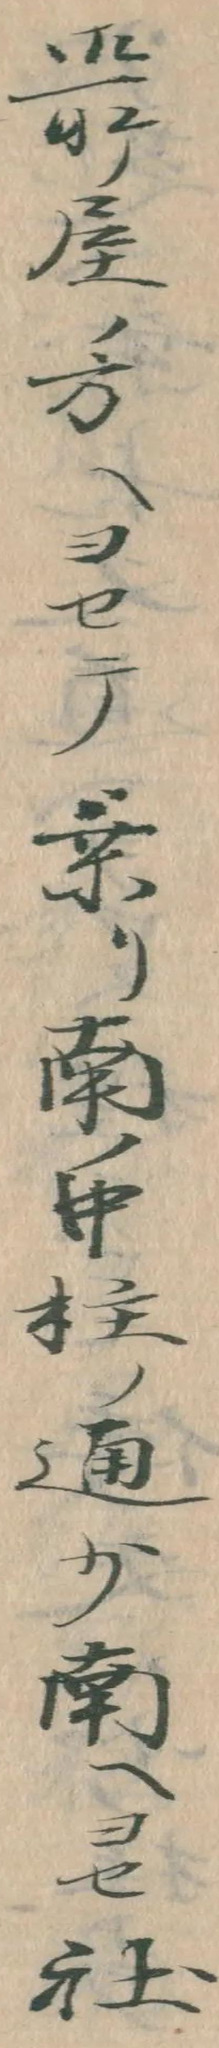御所屋ノ方ヘヨセテ乗リ南ノ中柱ノ通少南へヨセ社
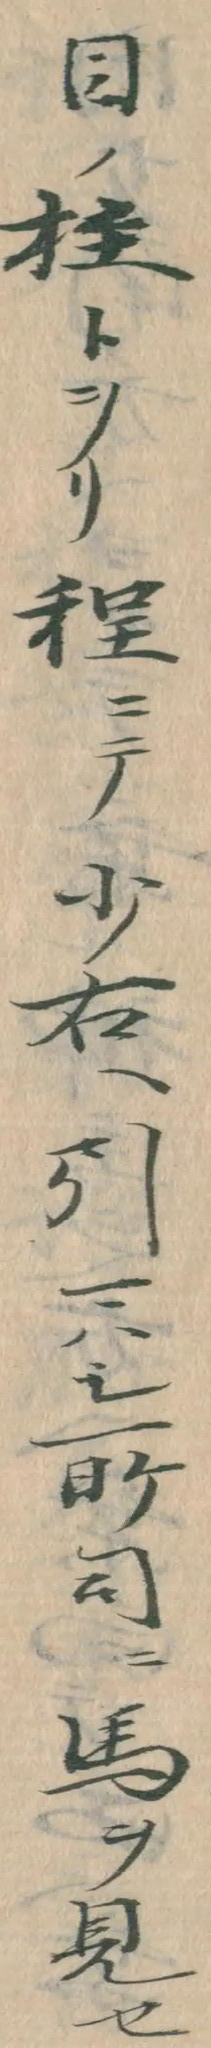目ノ柱トヲリ程ニテ少右ヘ引マハシ所司ニ馬ヲ見セ
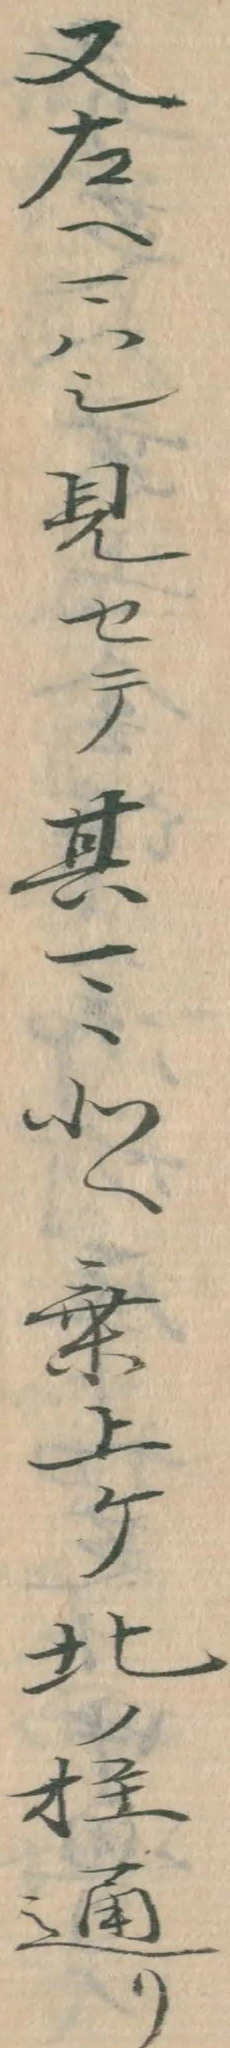又左ヘマハシ見セテ其マヽ北へ乗上ケ北ノ柱通リ

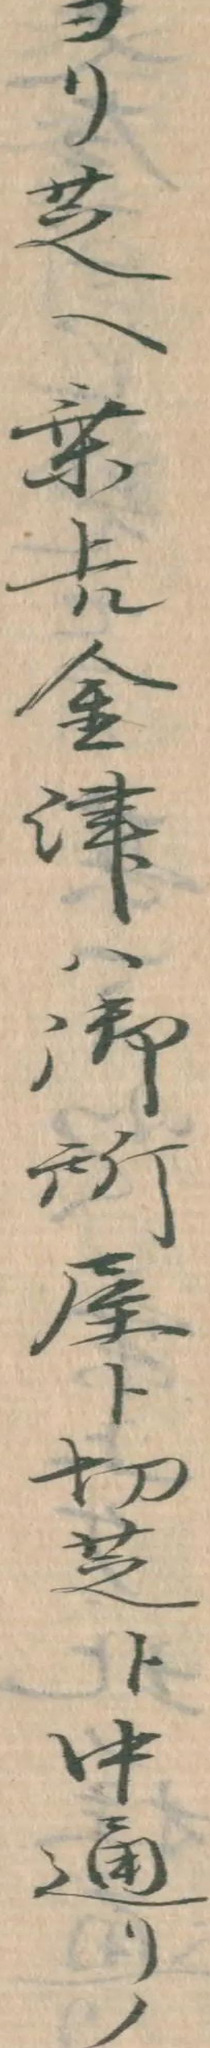ヨリ芝へ乗上ル金津ハ御所屋ト切芝ト中通リノ
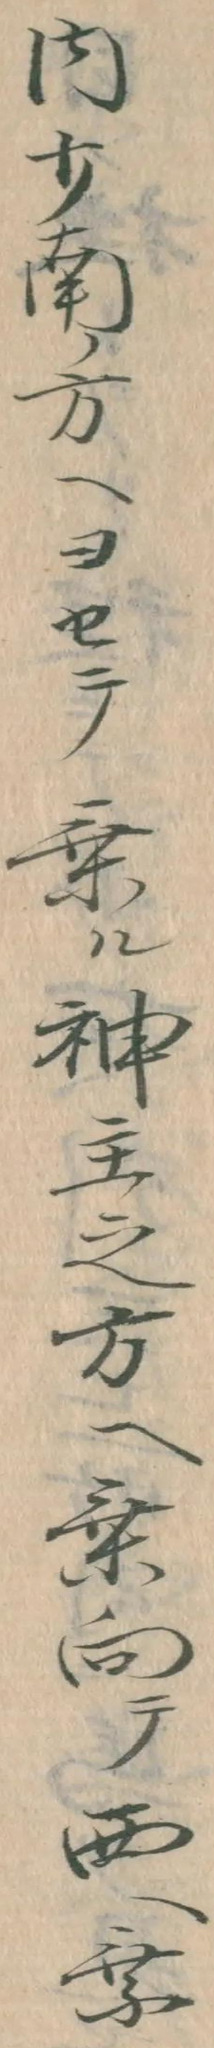内少南ノ方ヘヨセテ乗ル神主之方ヘ乗向テ西へ乗
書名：賀茂社記録. 第11冊
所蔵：国立国会図書館 National Diet Library, JAPAN
